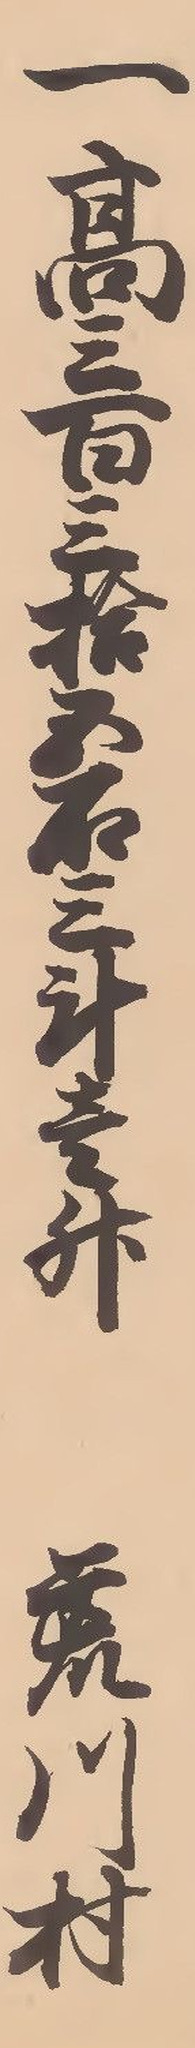一高三百三拾五石三斗壱升荒川村
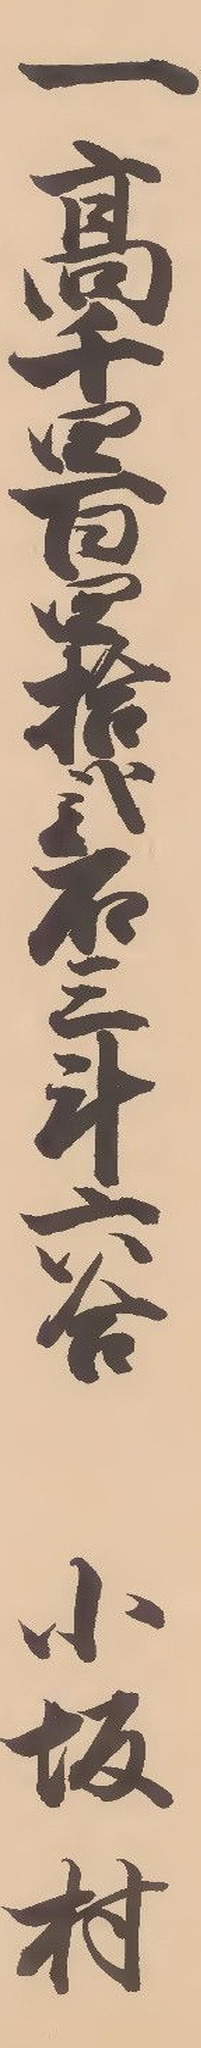一高千四百四拾弐石三斗六合小坂村
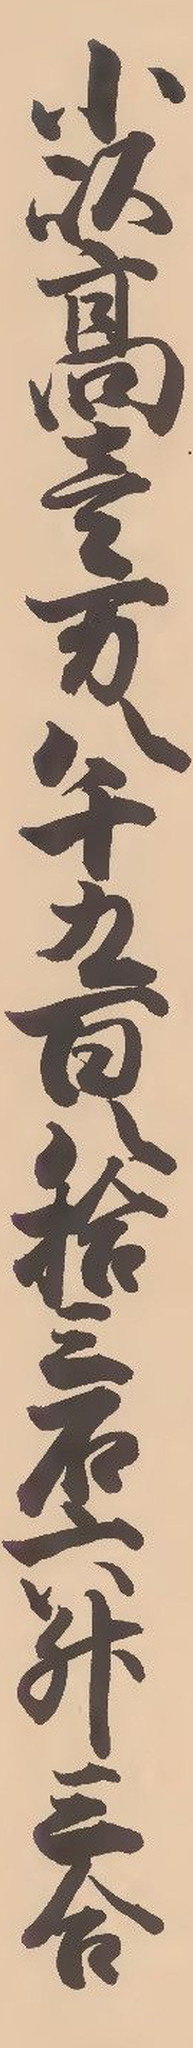小以高壱万八千九百八拾三石六升三合

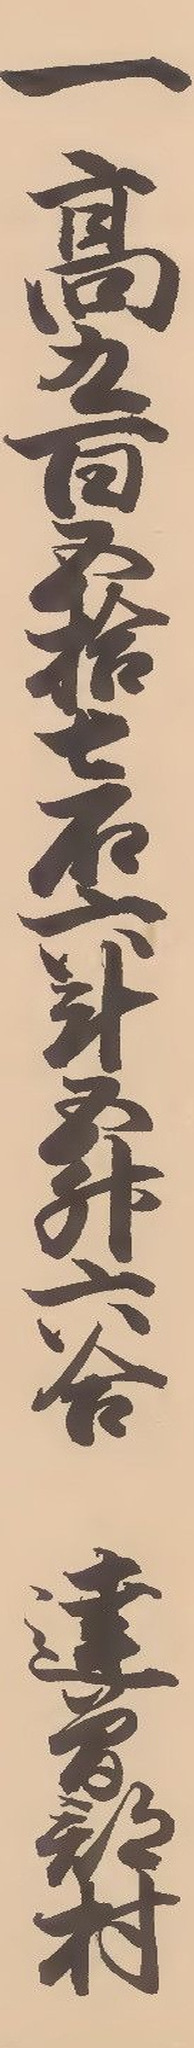一高九百五拾七石六斗五升六合達曽部村
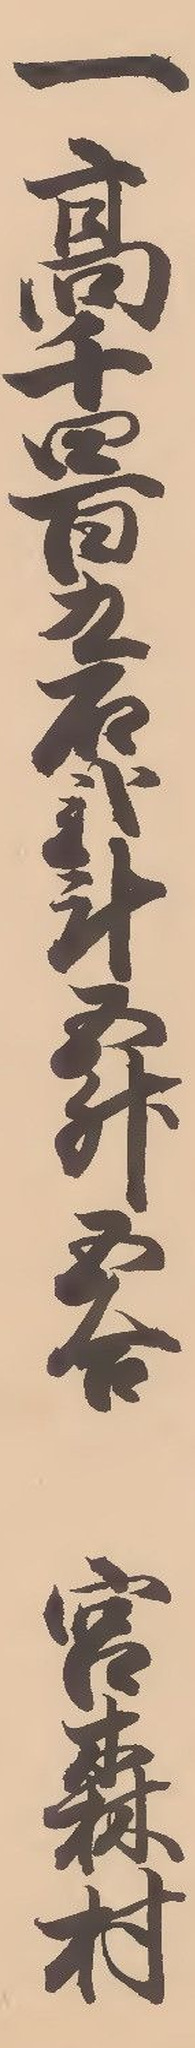一高千四百九石弐斗五升五合宮森村
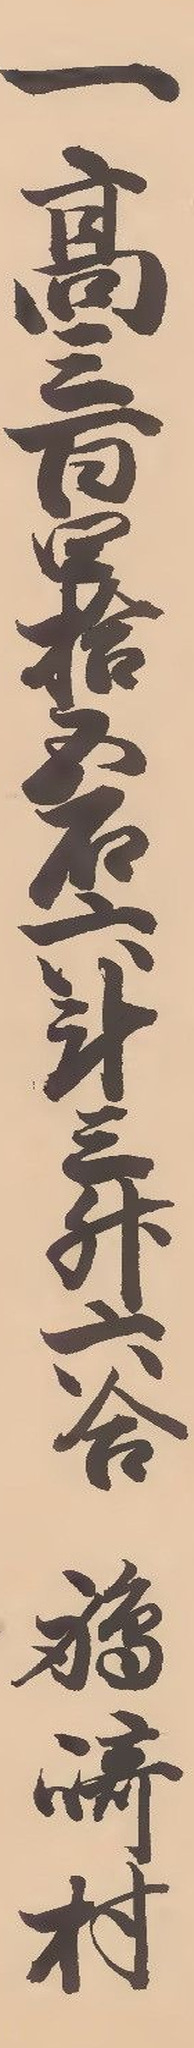一高三百四拾五石六斗三升六合鵢崎村
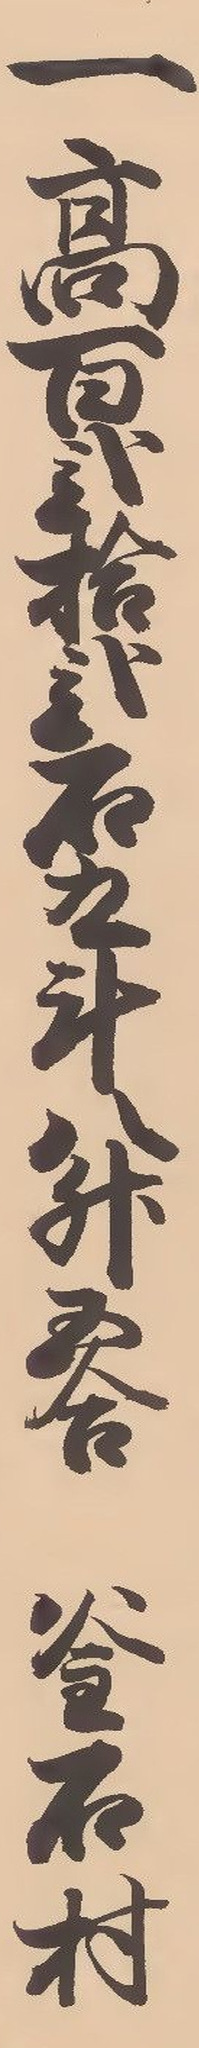一高百弐拾弐石九斗八升五合釜石村
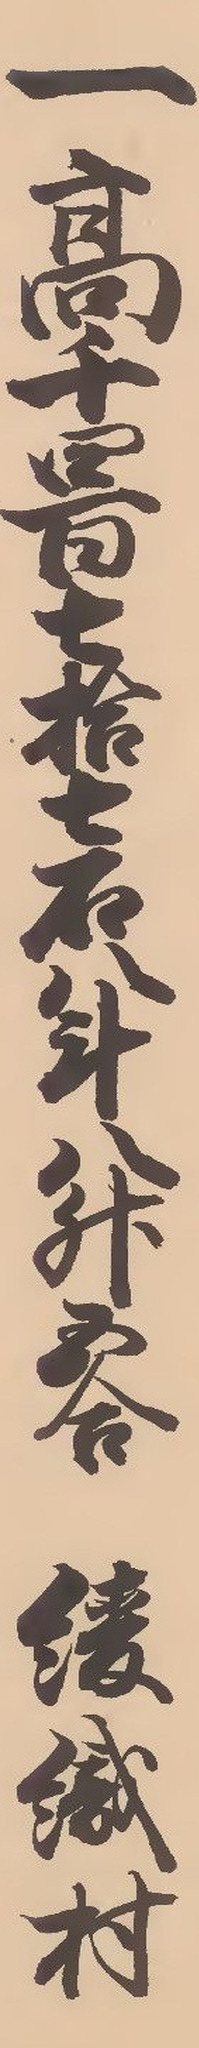一高千四百七拾七石八斗八升五合綾織村
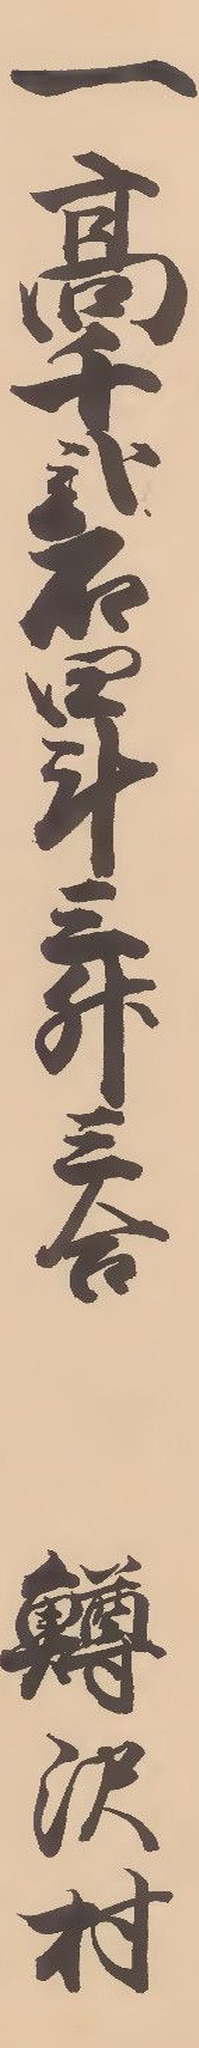一高千弐石四斗三升三合鱒沢村
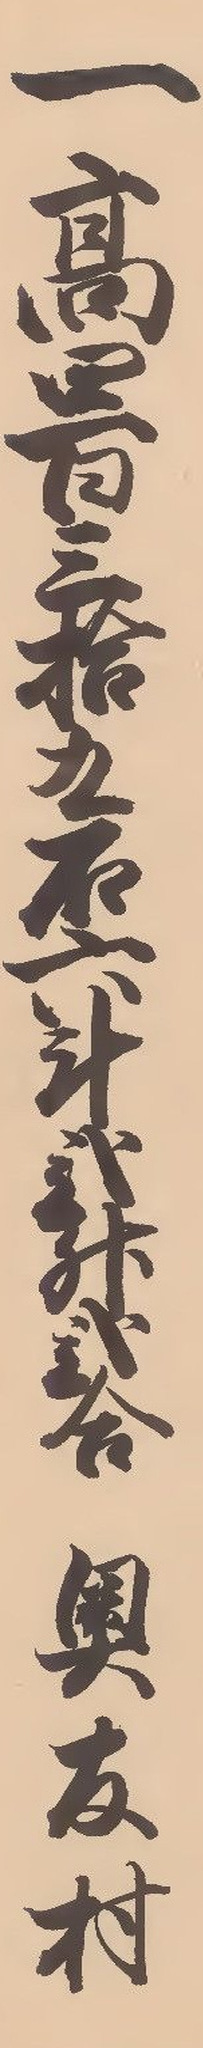一高四百三拾九石六斗弐升弐合奥友村

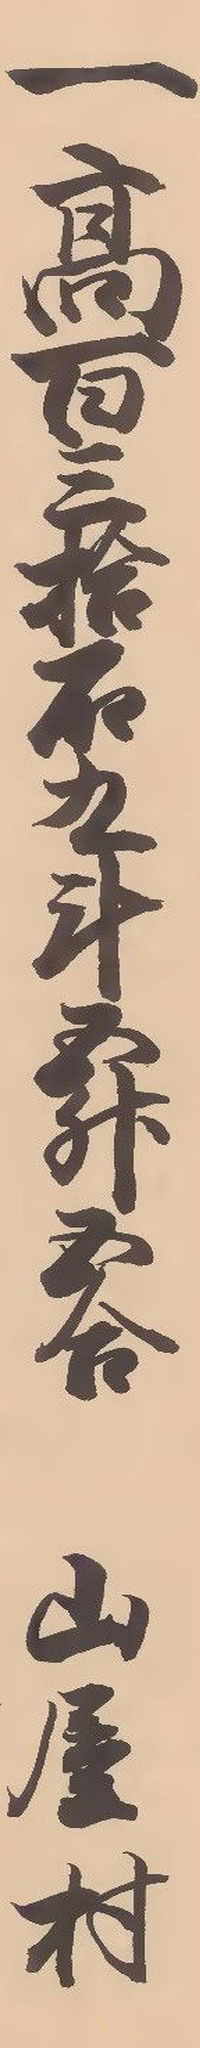一高百三拾石九斗五升五合山屋村
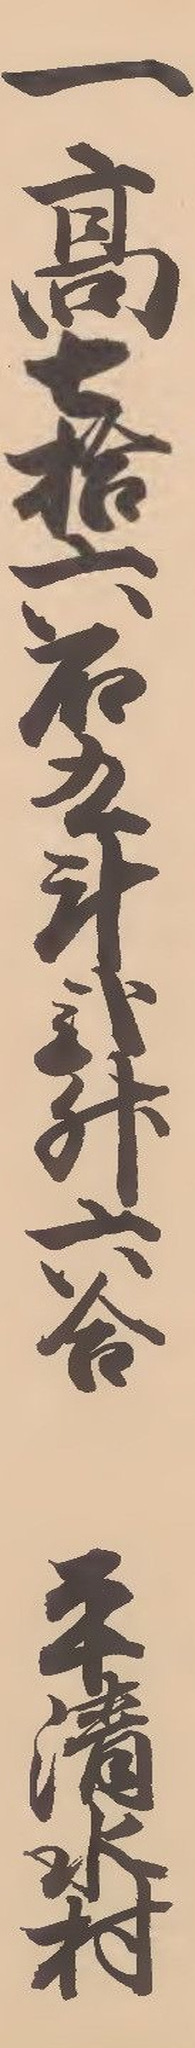一高七拾六石九斗弐升六合平清水村
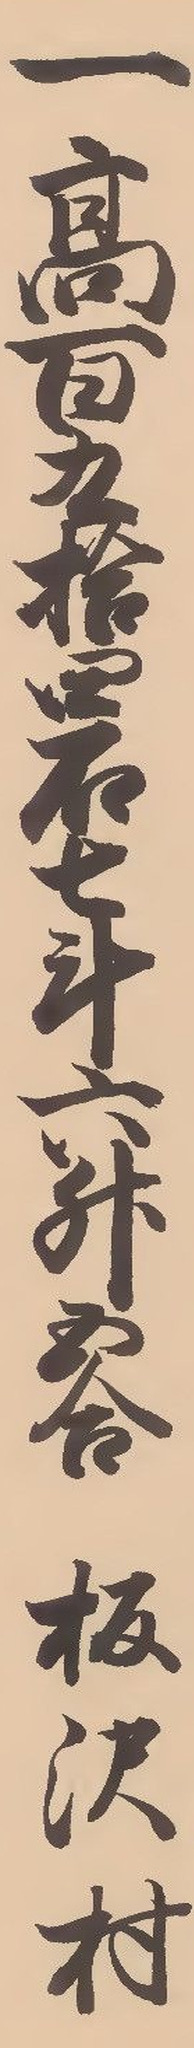一高百九拾四石七斗六升五合板沢村
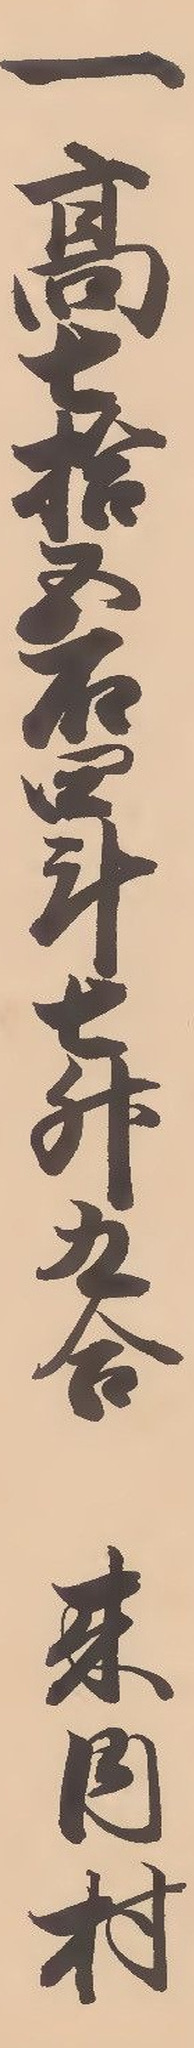一高七拾五石四斗七升九合来内村
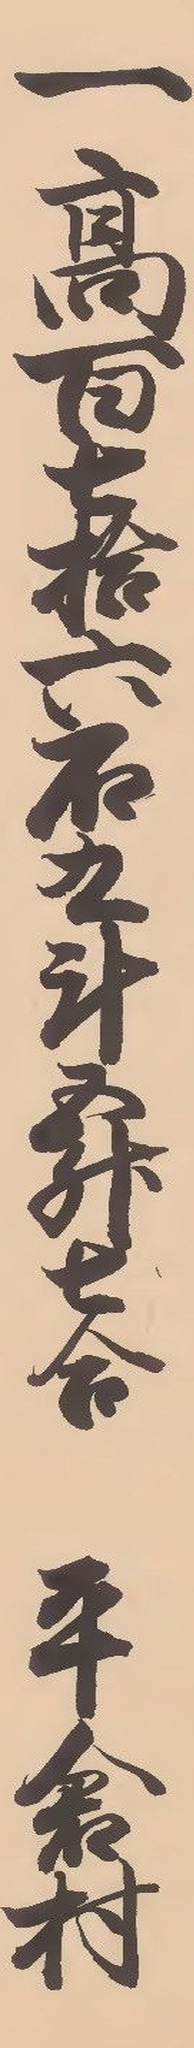一高百七拾六石九斗五升七合平倉村
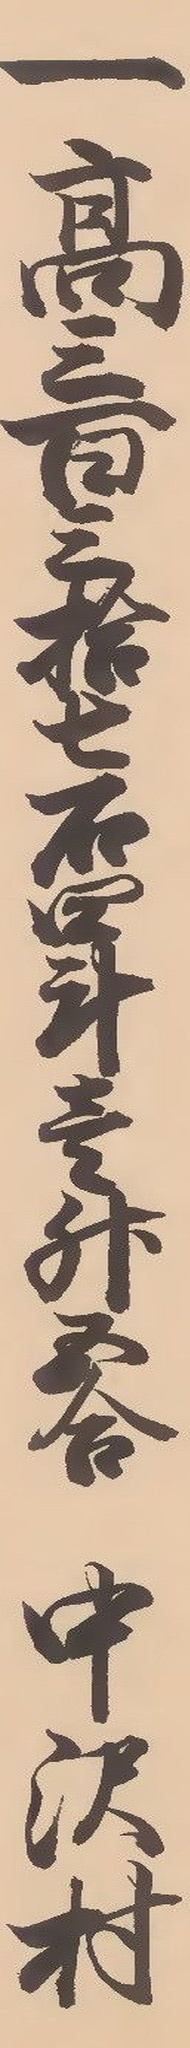一高三百三拾七石四斗壱升五合中沢村
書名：陸奥国郷帳　６
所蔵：国立公文書館 National Archives of Japan
